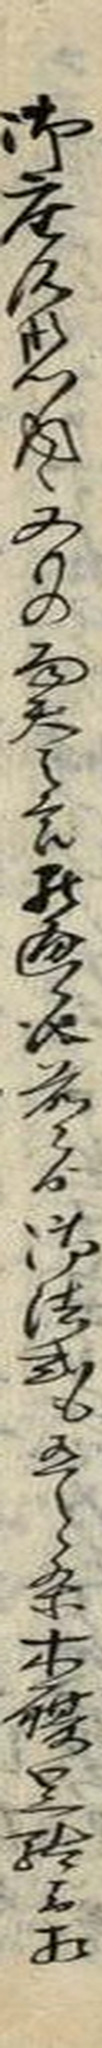御座所御門内へ又もの雨天之節罷通候儀前々ゟ御法式も有之候条木履足駄に而相
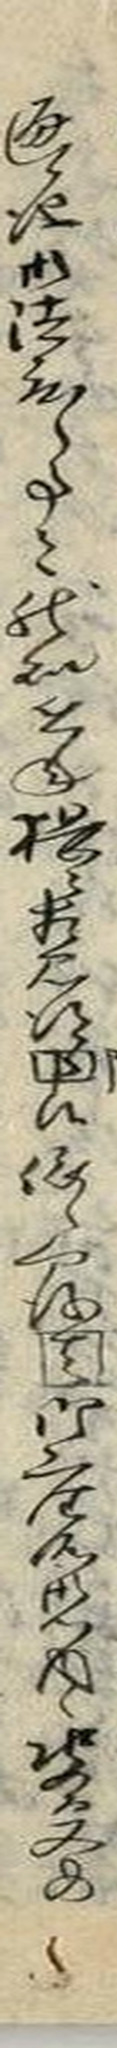通候儀御法度之事に候然処近年猥に相見得申候依之向後御座所御門内へ決而又もの
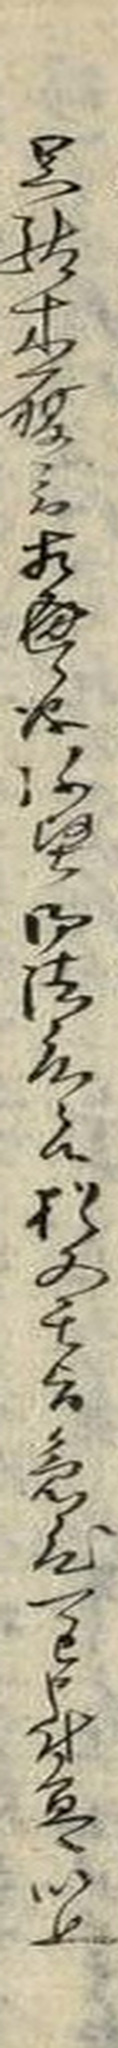足駄木履に而相通候儀弥堅御法度に候猶又其旨急度可被申付置候以上
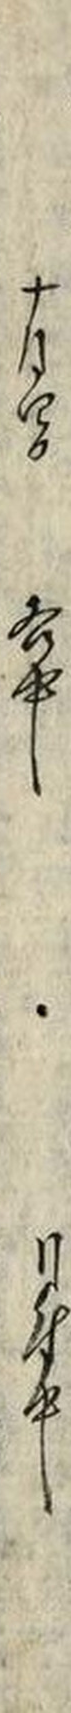十月四日各中目付中
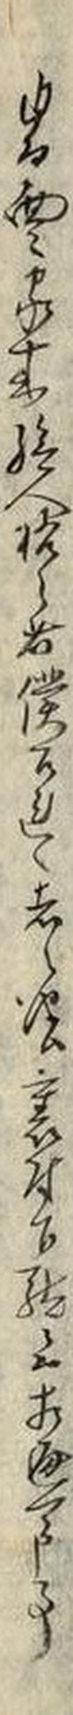追而面々家来給人格之者僕召連候者之儀は裏付下駄に而相通可申事候
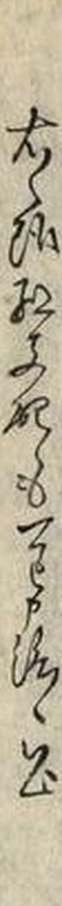右之趣組支配へも可被申渡候以上
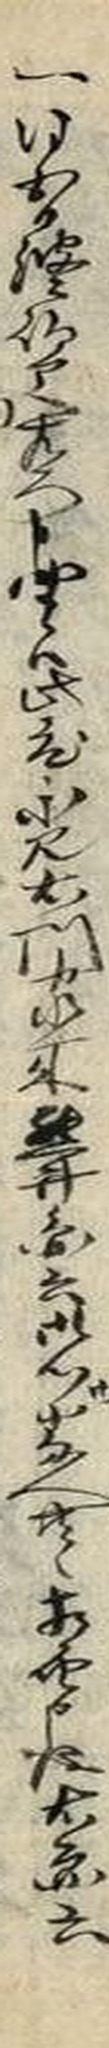一同五日波々伯部八左衛門申聞候は此度永見右門家来熊井円六御門御番人共へ相届申儀右円六
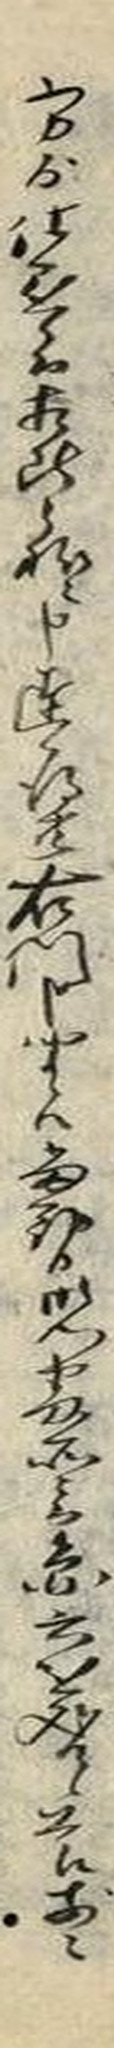方ゟ仕懸候而相断候様に申達候得共右門申聞候は当朔日御門番所に而円六を咎候節前々
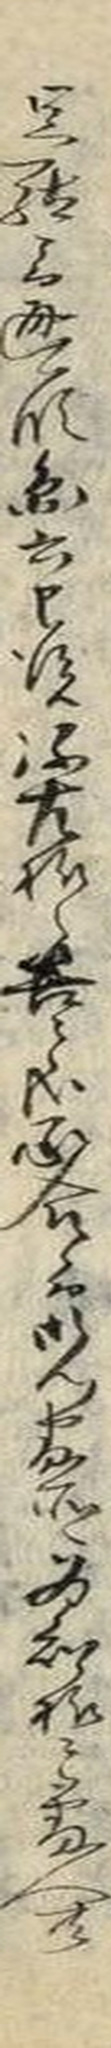足駄に而通候段円六申候得ハ弥左様之筈に候哉承合候而御門番所へ為知候様に御番人共
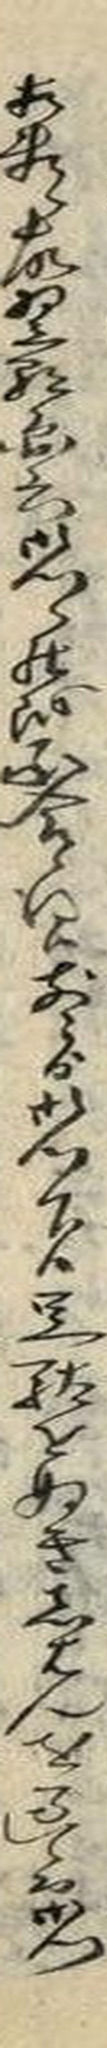相頼候故翌朝円六御門へ罷越承合候得は前々ゟ御門下は足駄をぬきしはんを過候而御門
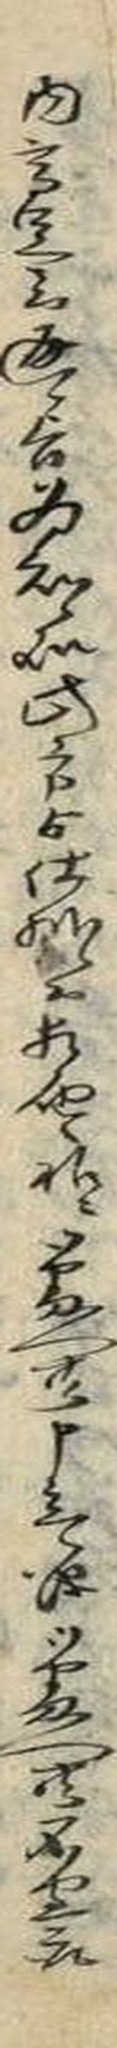内高足に而通候旨為知候処此方ゟ仕掛候而相届候様に御番人共申立候儀御番人共不宜取
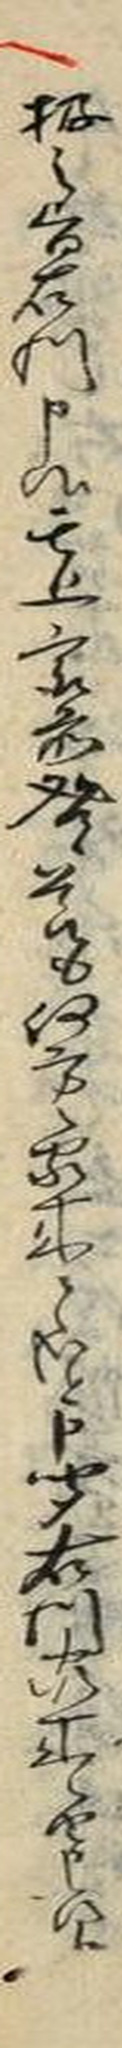扱之旨右門申候其上最前咎候節も何方之家来候哉と申聞右門家来候由申候得は

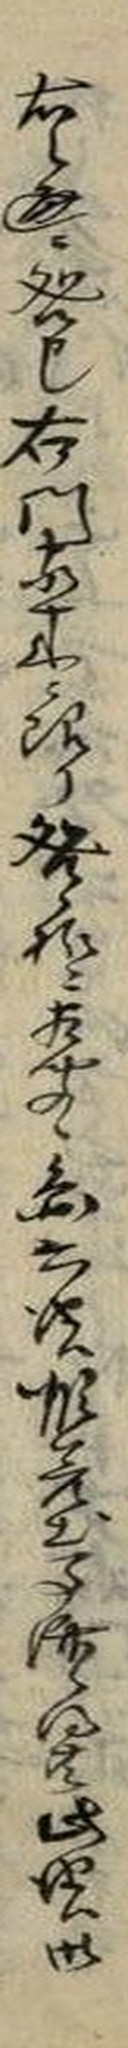右之通ニ咎申候右門家来に限り咎候様に相聞候円六儀は順差出事済候得共此儀は御
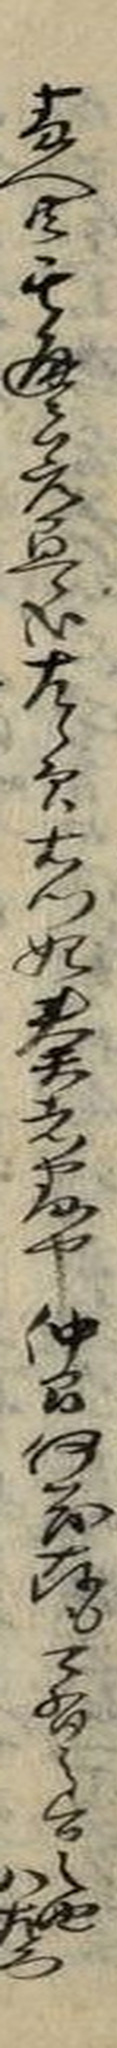番人共其通に差置候哉左候而は右門始奏者番中仲間何も存も可有之旨の由八左衛門
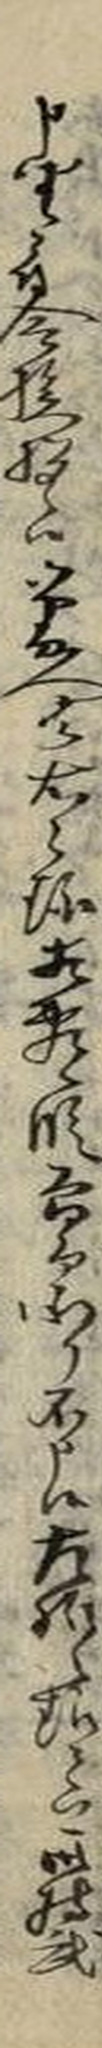申聞候に付令挨拶候は御番人共右之趣相頼候段曽而承り不申候左様之趣に候はゝ御持武
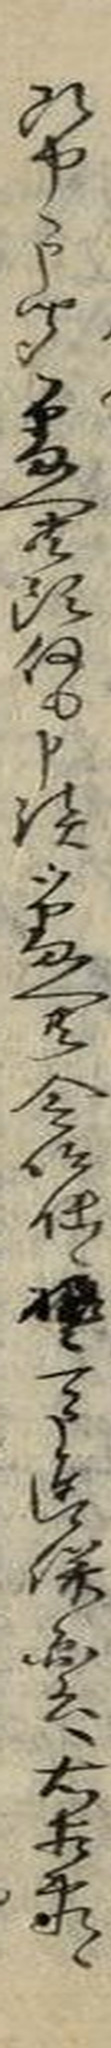頭中へ申聞御番人共頭何も申段御番人共令吟味候様に可申達候併円六へ右相頼候
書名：御門御櫓之部
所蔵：福井県文書館 Fukui Prefectural Archives
